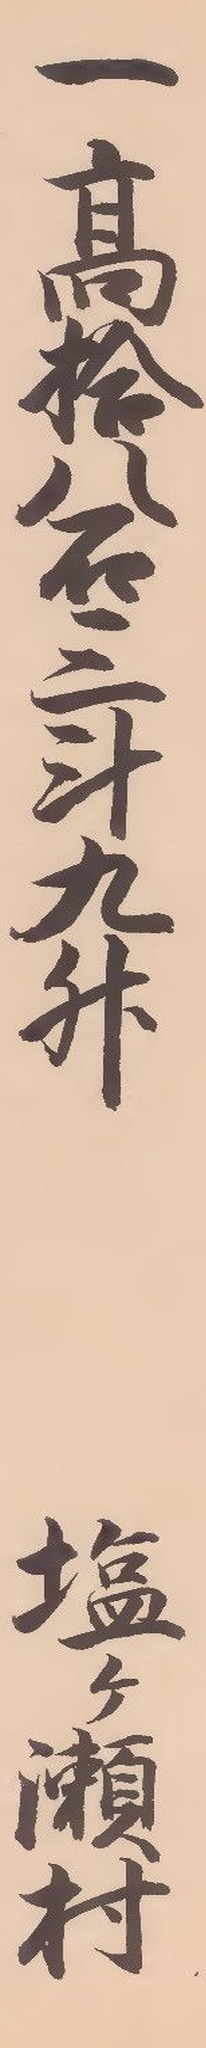一高拾八石三斗九升塩ケ瀬村
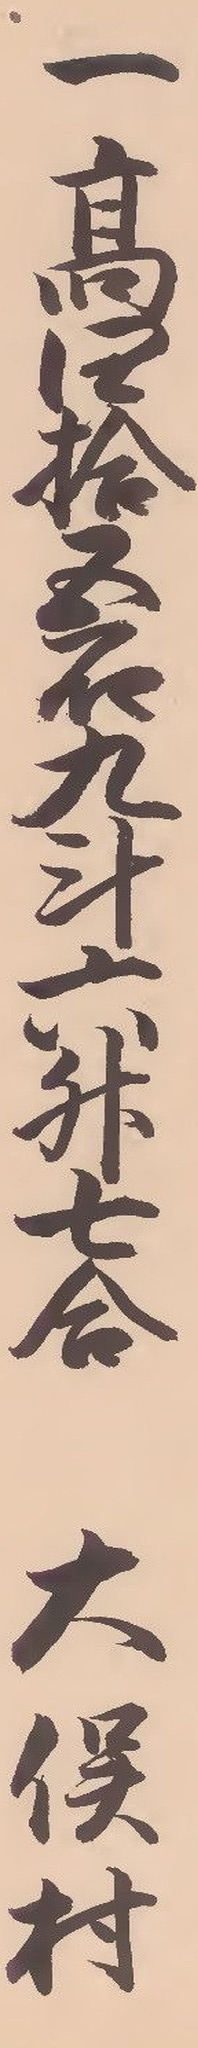一高四拾五石九斗六升七合大俣村

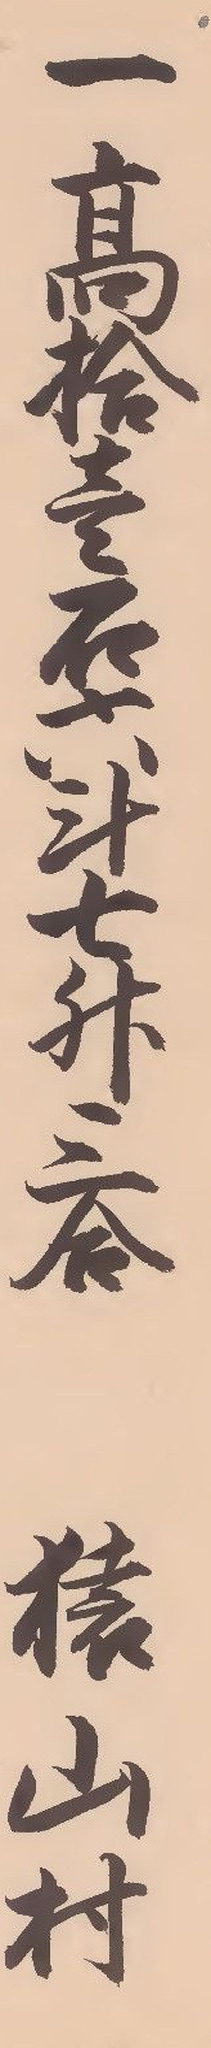一高拾壱石六斗七升三合猿山村
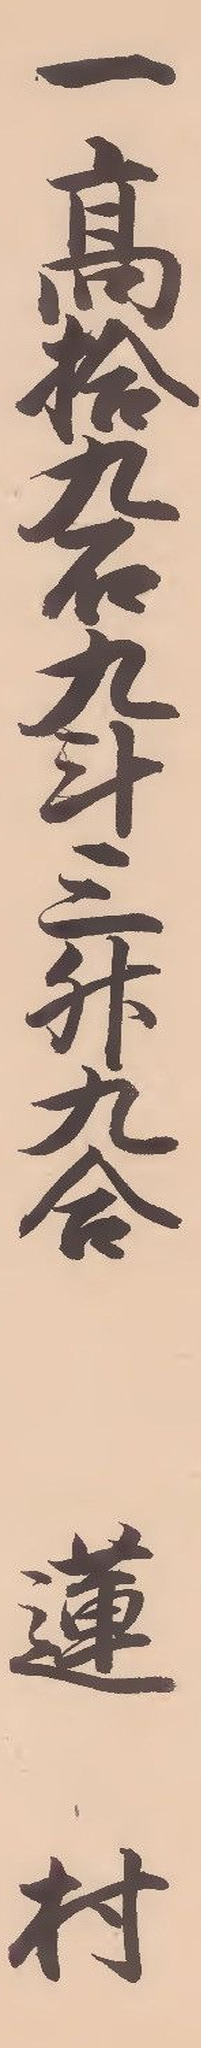一高拾九石九斗三升九合蓮村
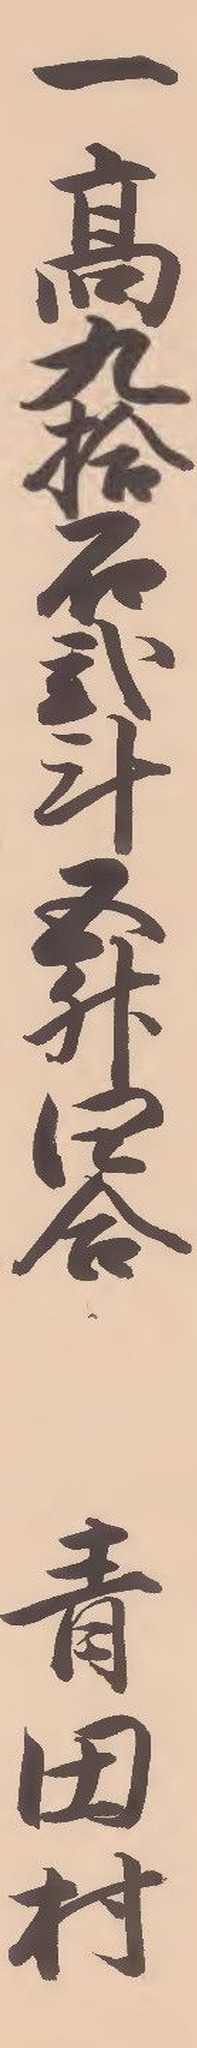一高九拾石弐斗五升四合青田村
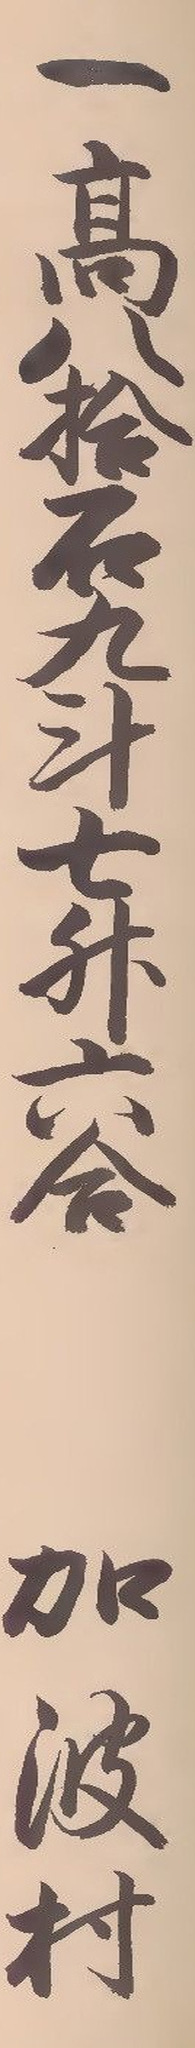一高八拾石九斗七升六合加波村
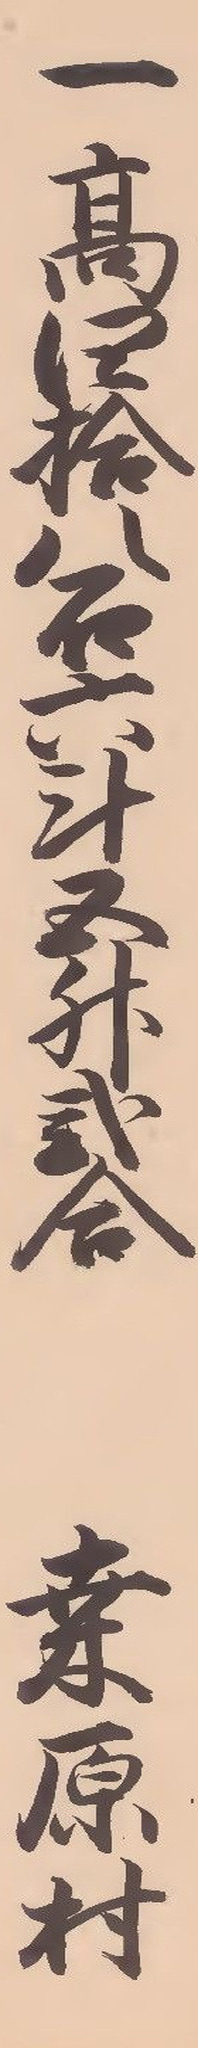一高四拾八石六斗五升弐合桑原村
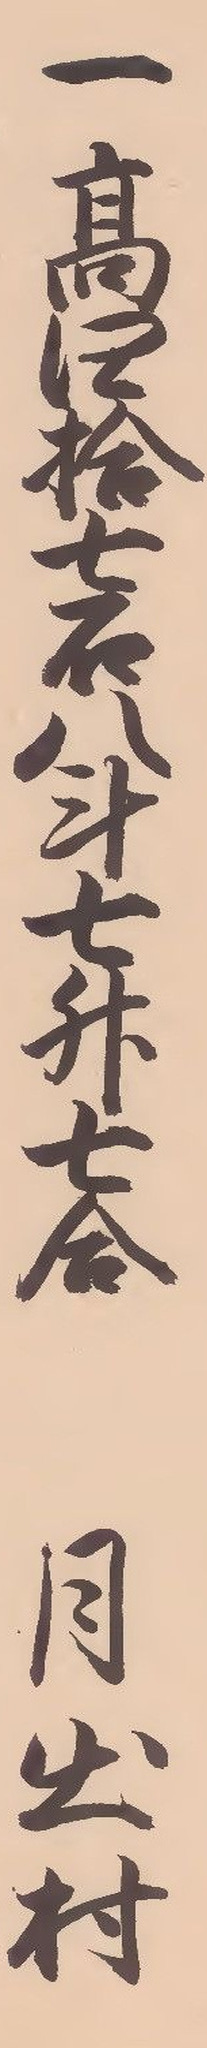一高四拾七石八斗七升七合月出村
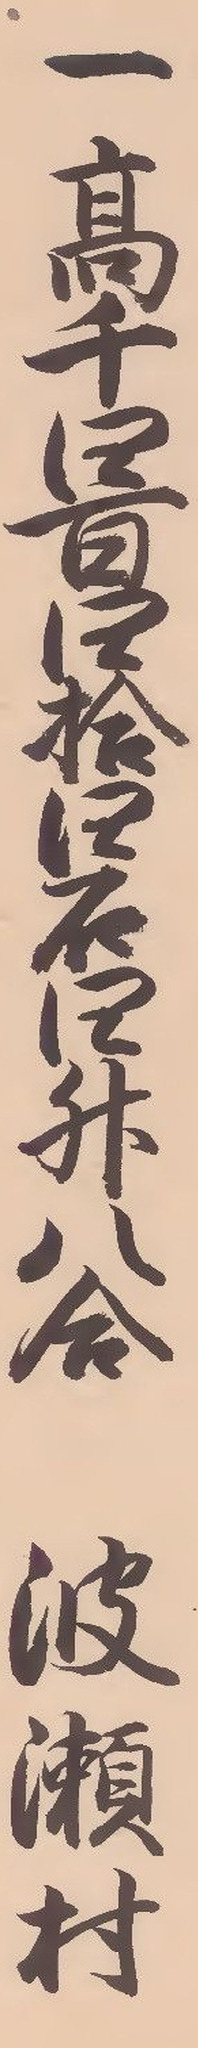一高千四百四拾四石四升八合波瀬村

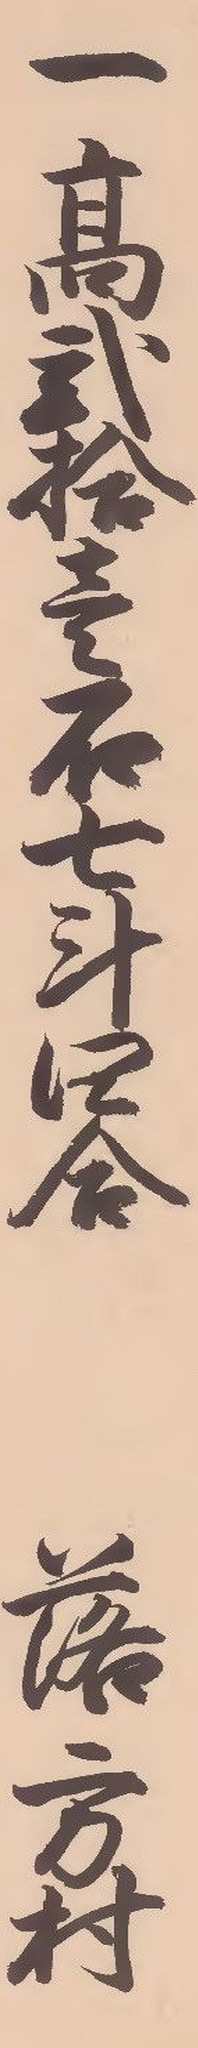一高弐拾壱石七斗四合落方村
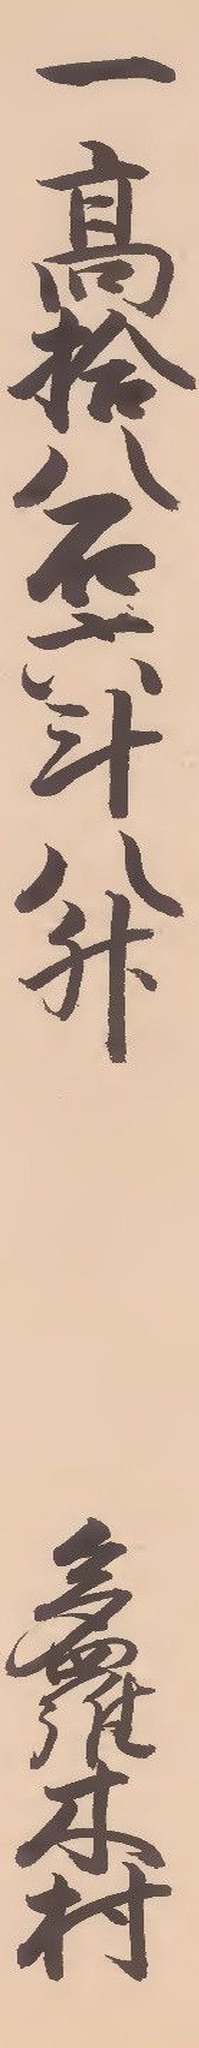一高拾八石六斗八升多羅木村
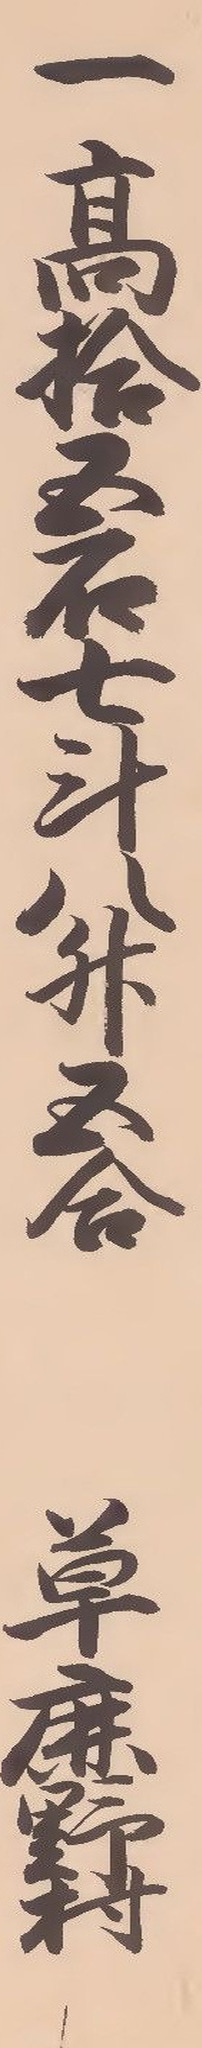一高拾五石七斗八升五合草鹿野村
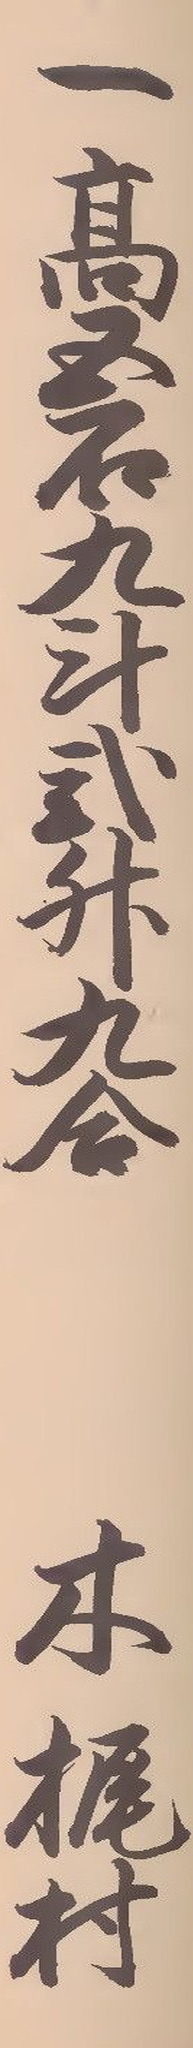一高五石九斗弐升九合木梶村
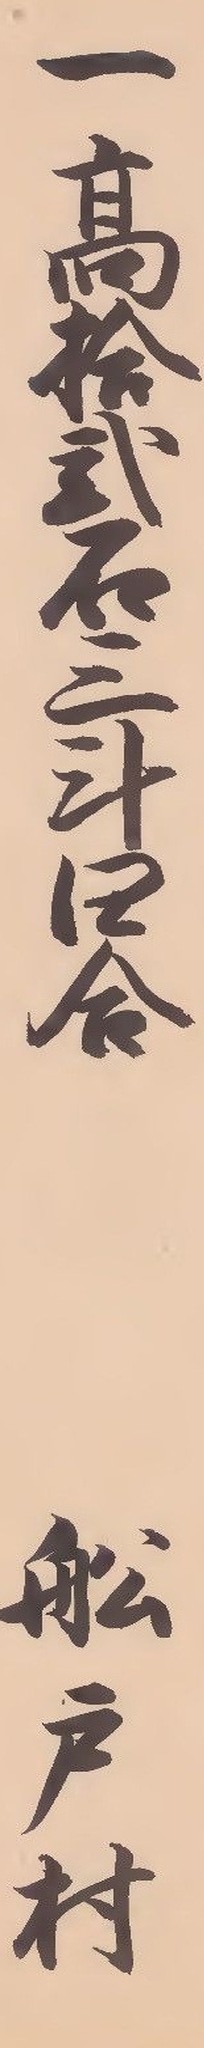一高拾弐石三斗四合船戸村
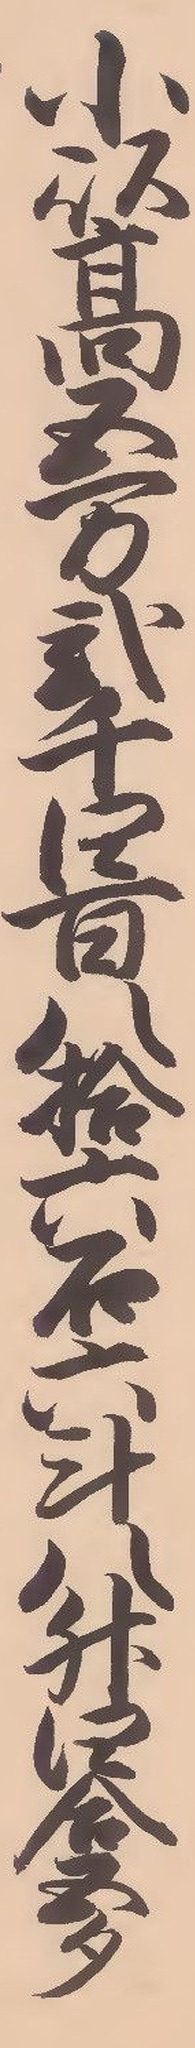小以高五万弐千四百八拾六石六斗八升四合五勺

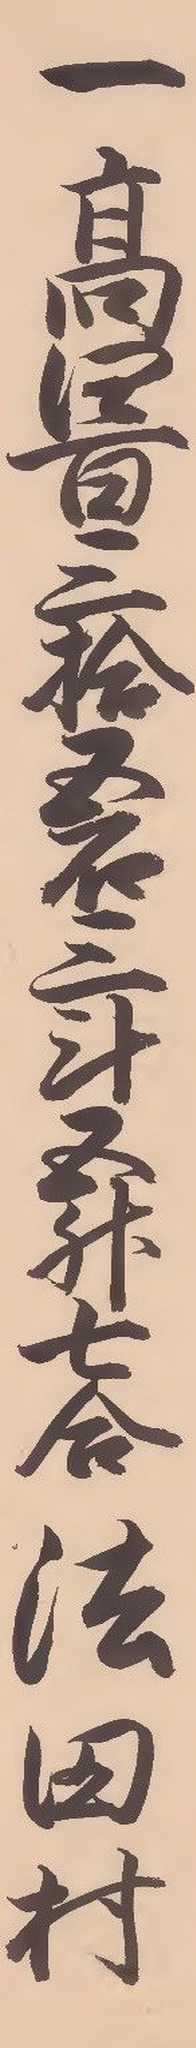一高四百三拾五石三斗五升七合法田村
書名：伊勢国郷帳
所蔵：国立公文書館 National Archives of Japan
